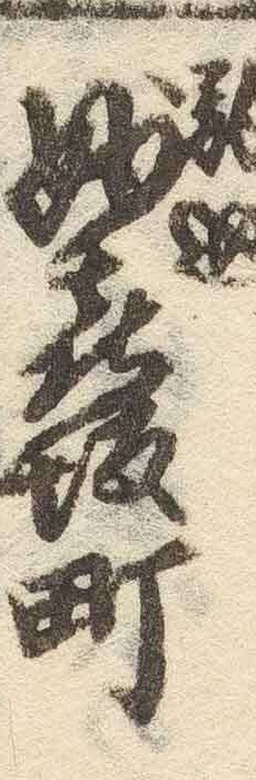妙喜坂町
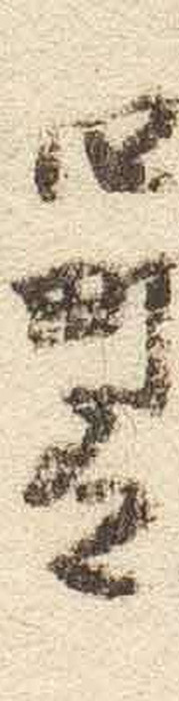四町有
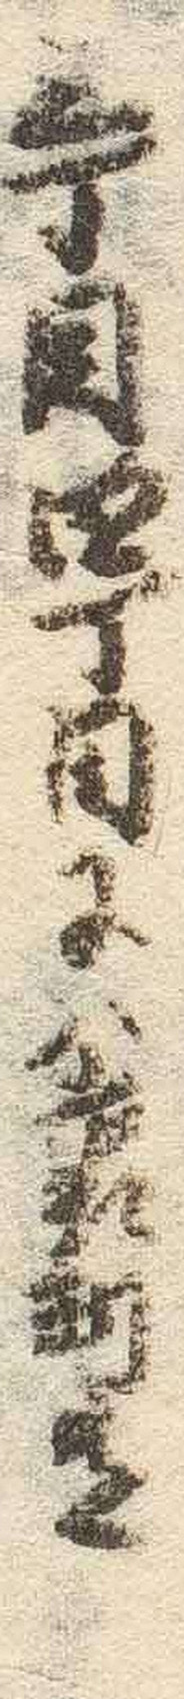三丁目四丁目には裏町有
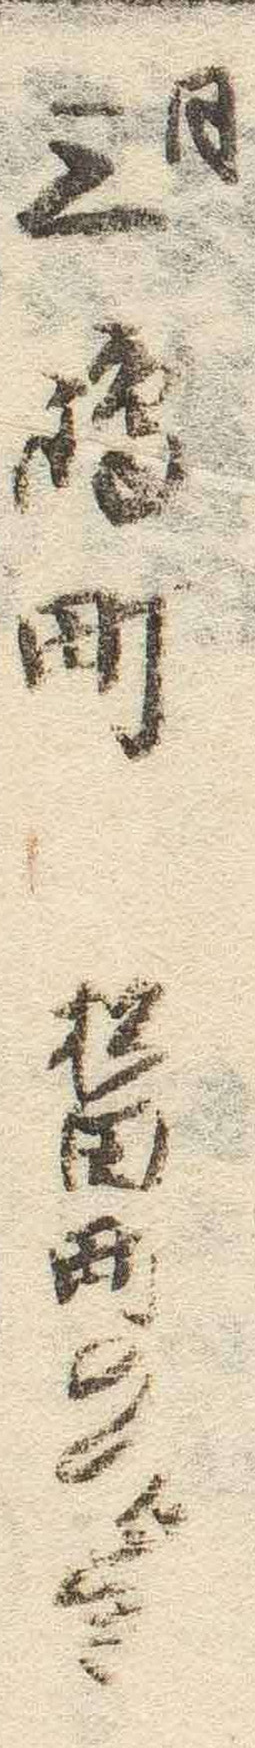三嶋町松田町のつゞき
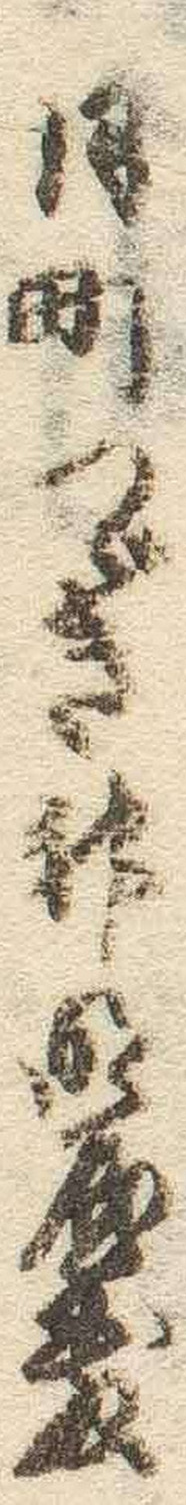同町つゞき神明屋敷
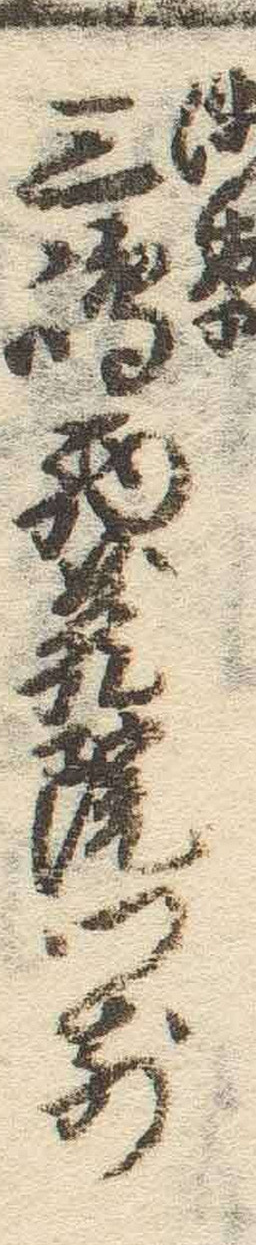三嶋西蔵院門前
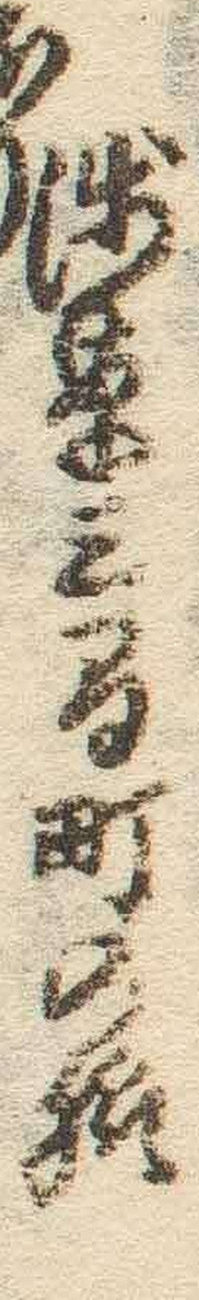浅草三間町の脇
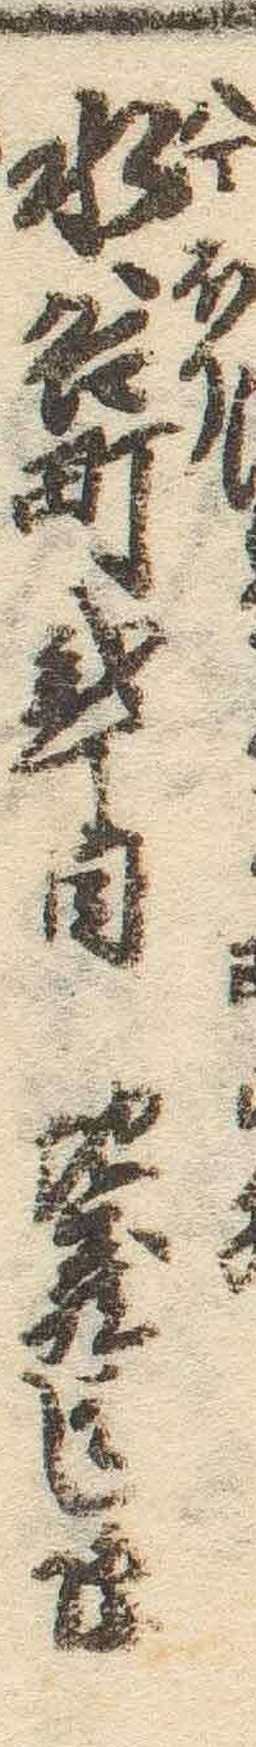水谷町弐丁目地蔵はし際
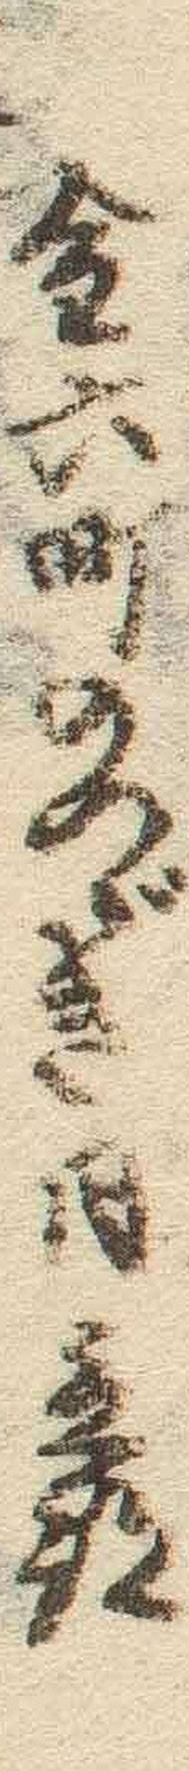金六町のつゞき同立跡
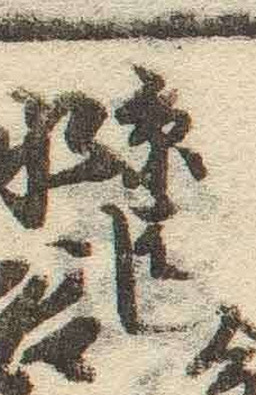京はし

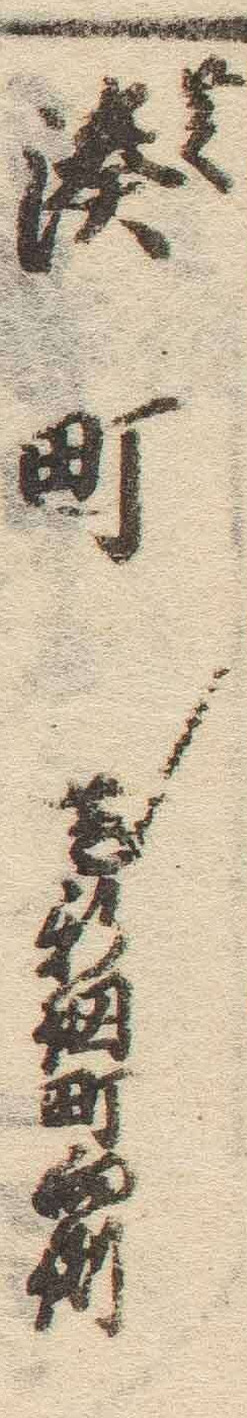湊町芝新網町向側
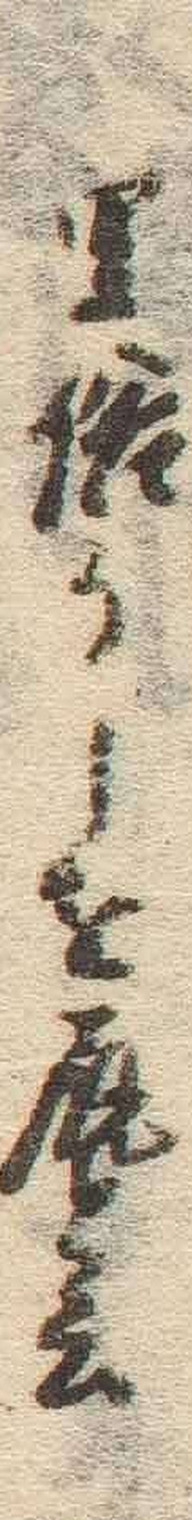里俗うしを尻と云
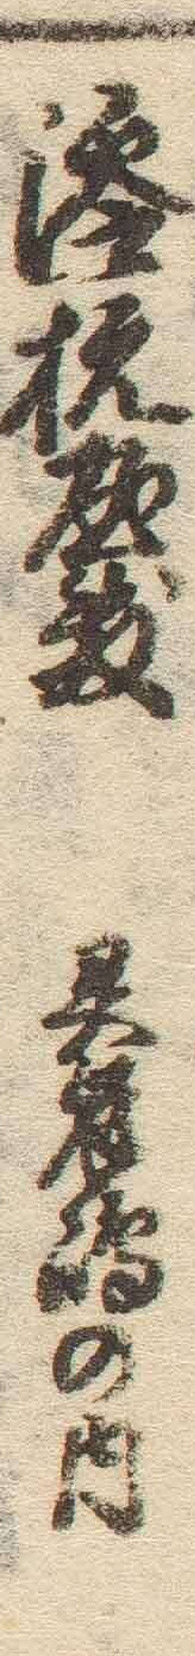澪杭屋敷霊岸島の内
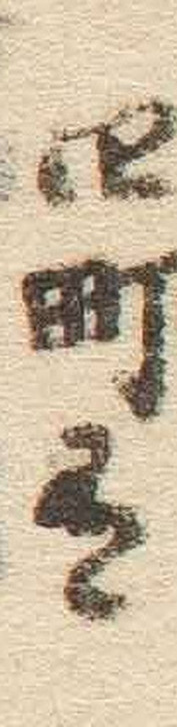四町有
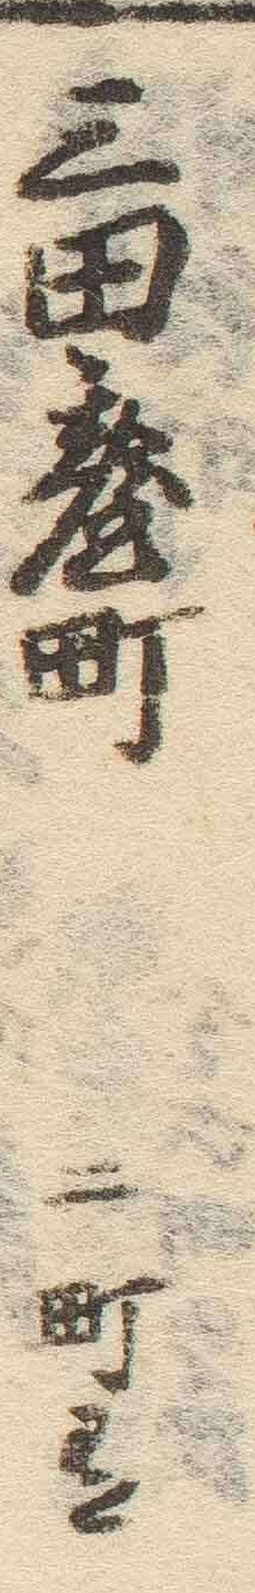三田台町二町有
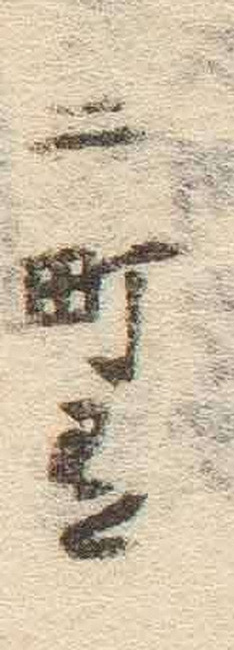四町有
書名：江戸町独案内
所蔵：東京学芸大学附属図書館 国文学研究資料館
